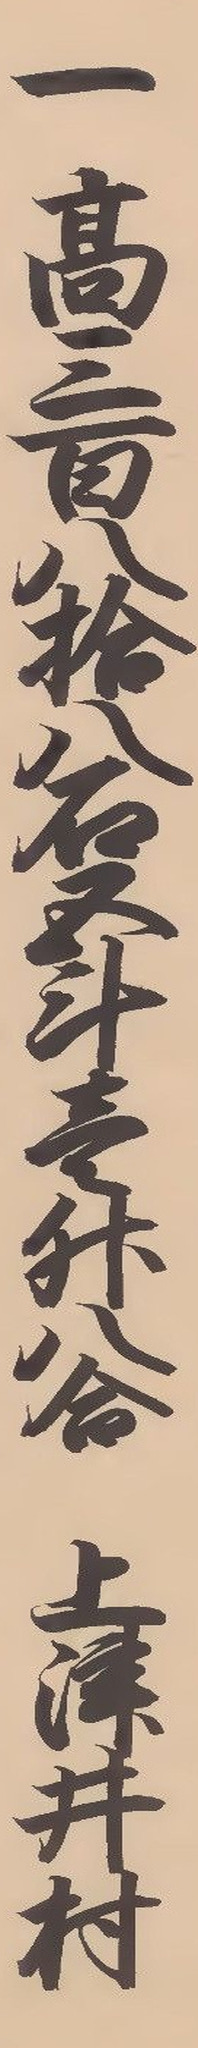一髙三百八拾八石五斗壱升八合上津井村
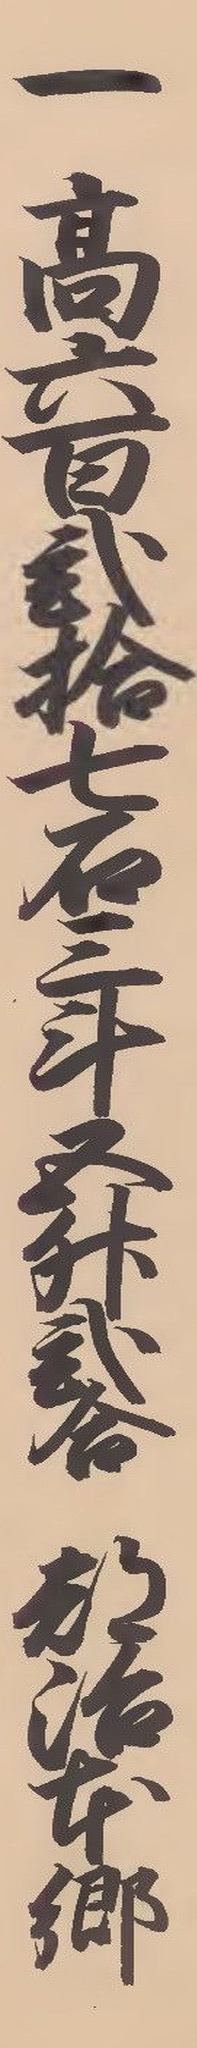一髙六百弐拾七石三斗五升弐合都治本郷
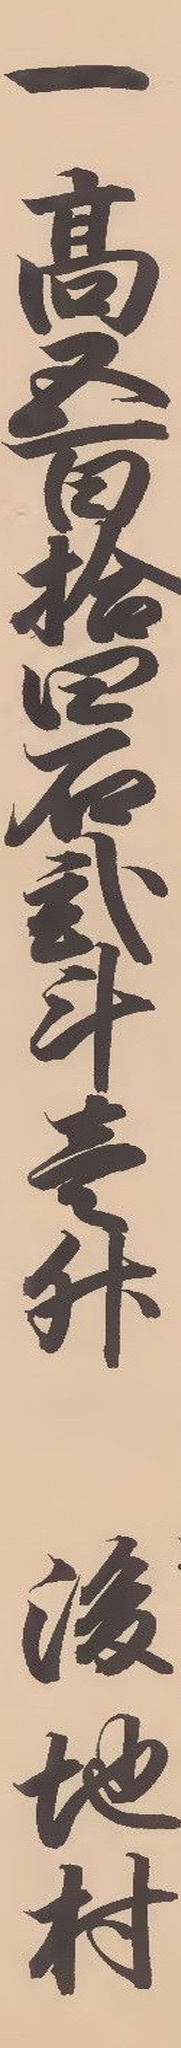一髙五百拾四石弐斗壱升後地村
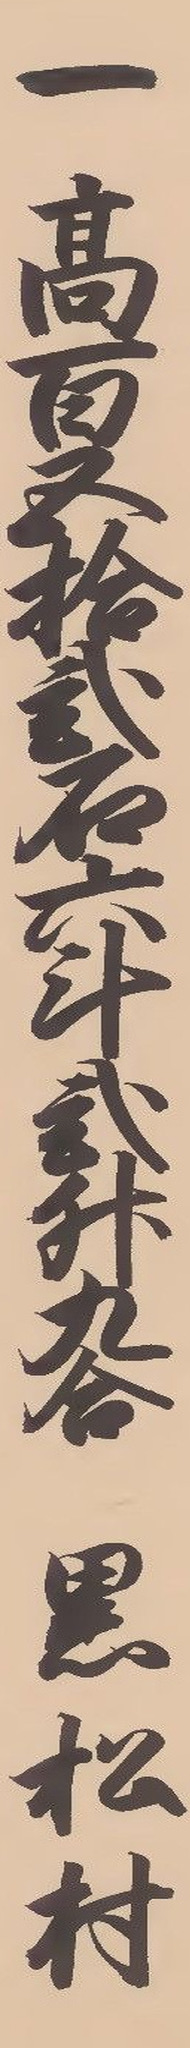一髙百五拾弐石六斗弐升九合黑松村
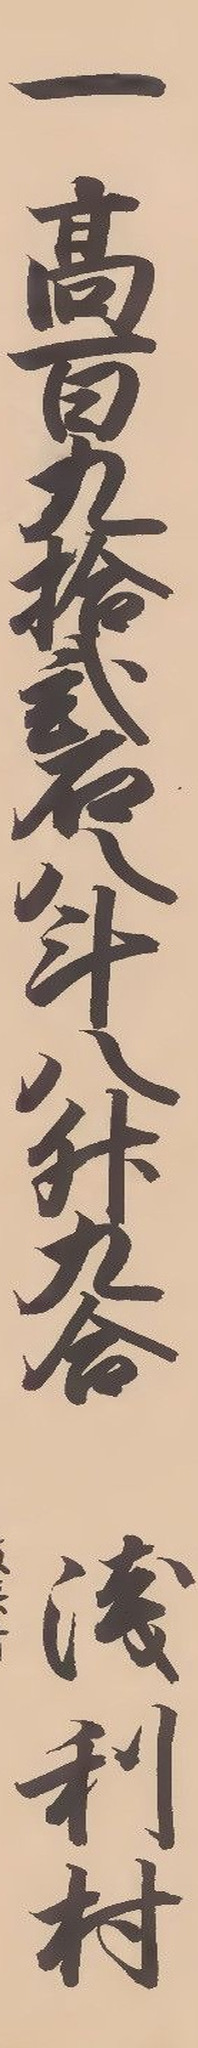一髙百九拾弐石八斗八升九合浅利村
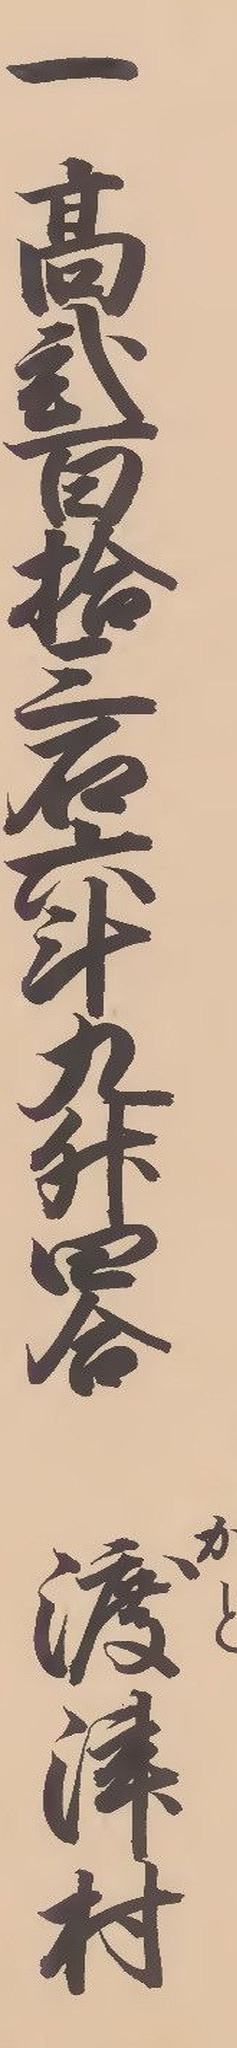一髙弐百拾三石六斗九升四合渡津村

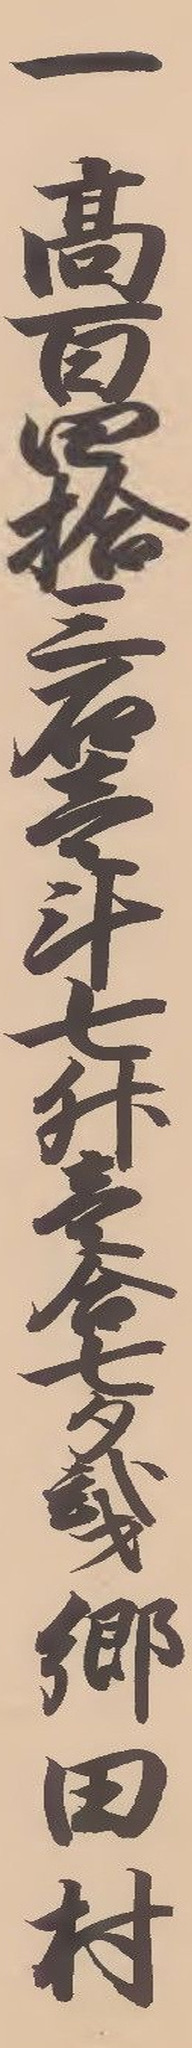一髙百四拾三石壱斗七升壱合七夕弐才郷田村
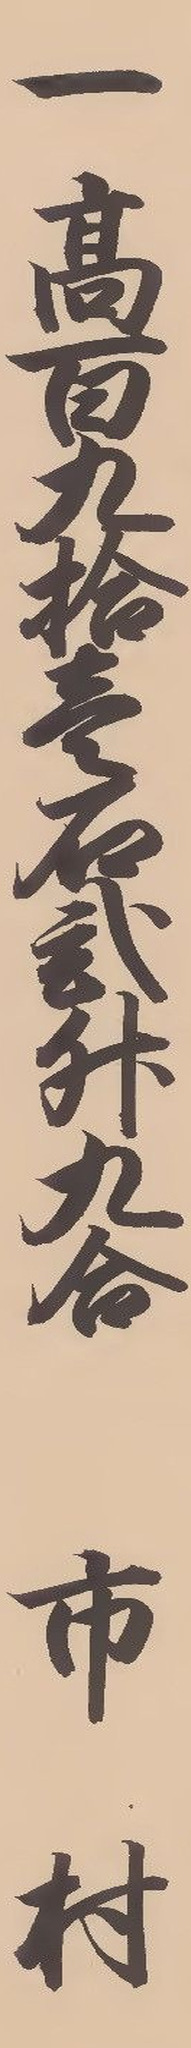一髙百九拾壱石弐升九合市村
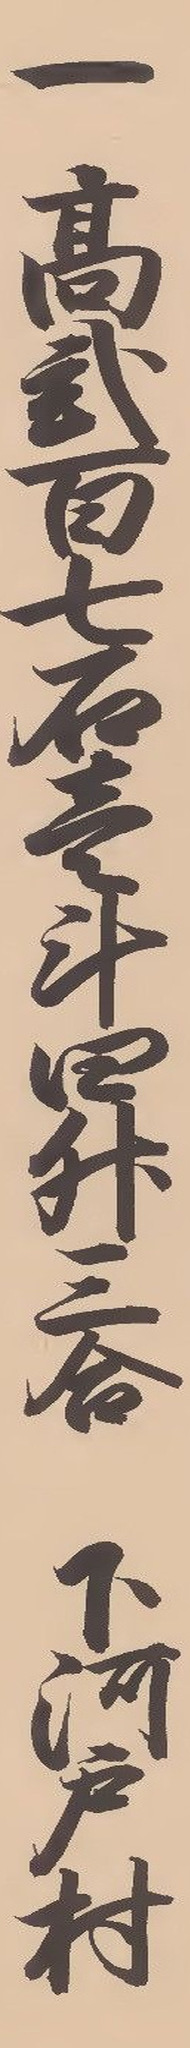一髙弐百七石壱斗四升三合下河戸村
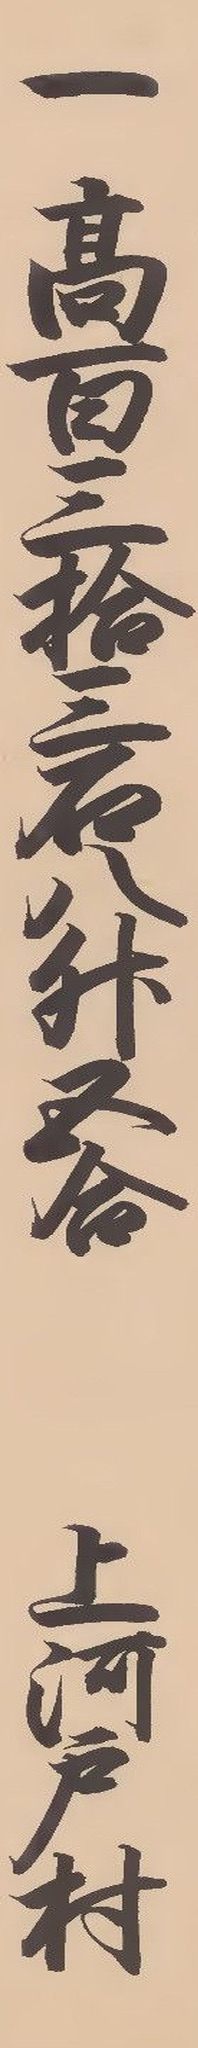一髙百三拾三石八升五合上河戸村
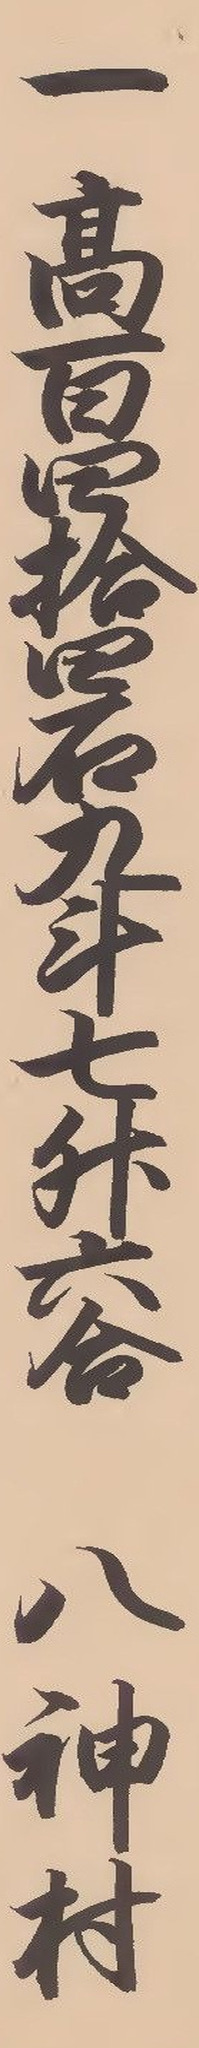一髙百四拾四石九斗七升六合八神村
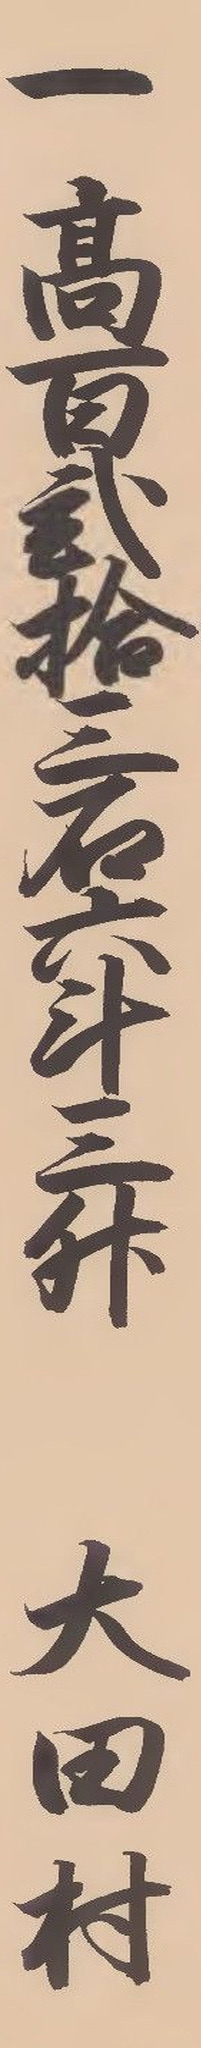一髙百弐拾三石六斗三升大田村
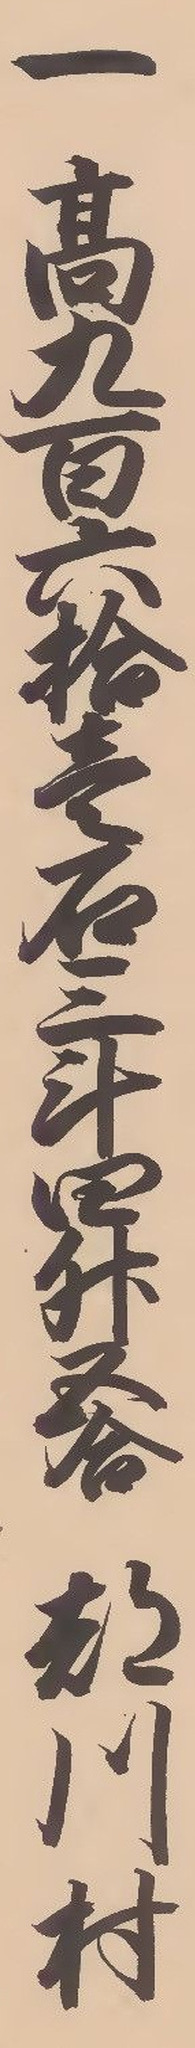一髙九百六拾壱石三斗四升五合都川村

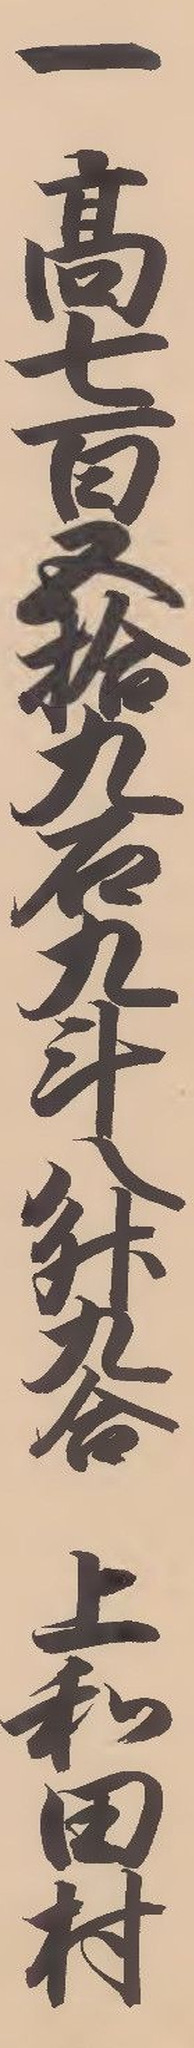一髙七百五拾九石九斗八升九合上和田村
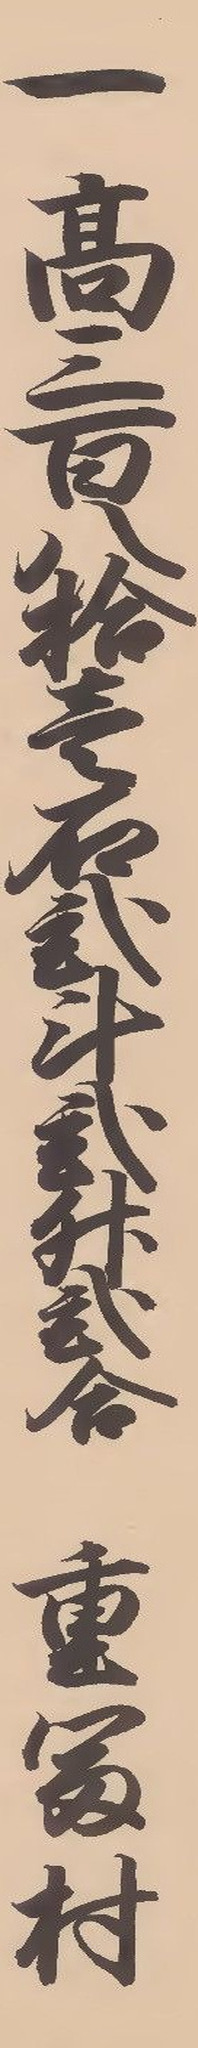一髙三百八拾壱石弐斗弐升弐合重冨村
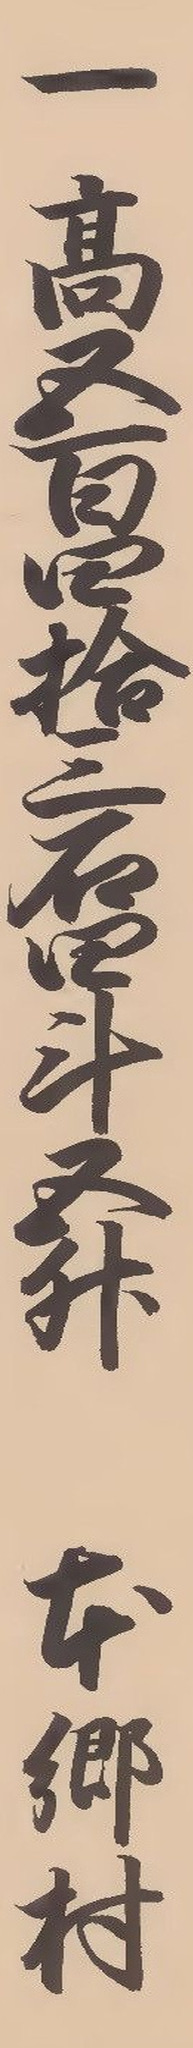一髙五百四拾三石四斗五升本郷村
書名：石見国郷帳
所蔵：国立公文書館 National Archives of Japan
